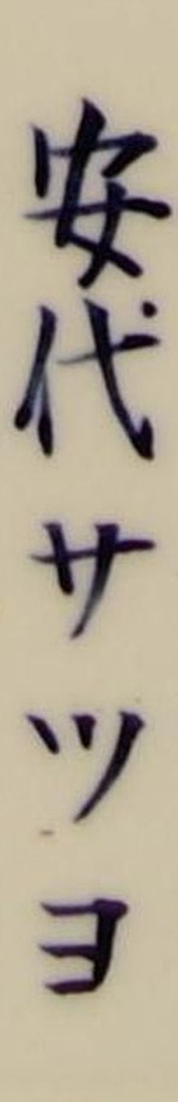安代サツヨ
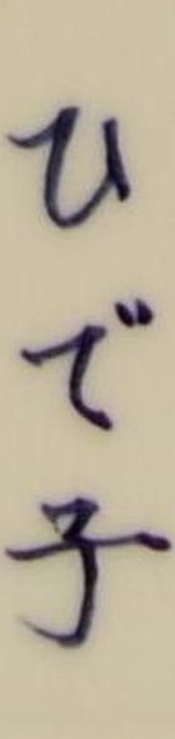ひで子
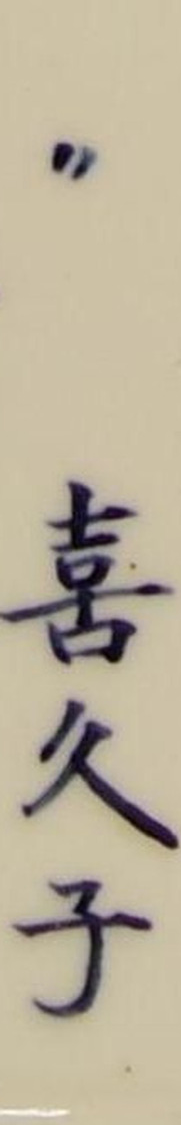喜久子
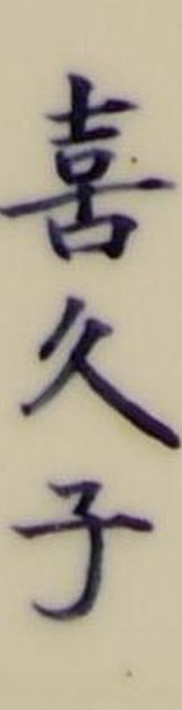喜久子
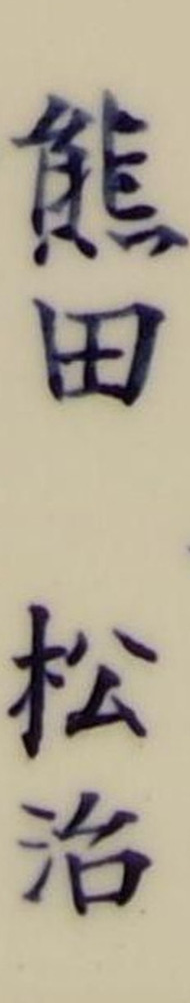熊田松治
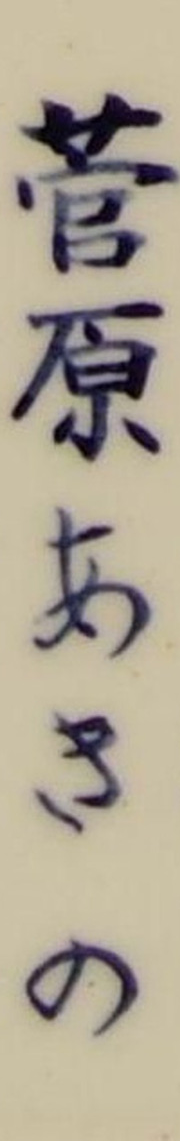菅原あきの
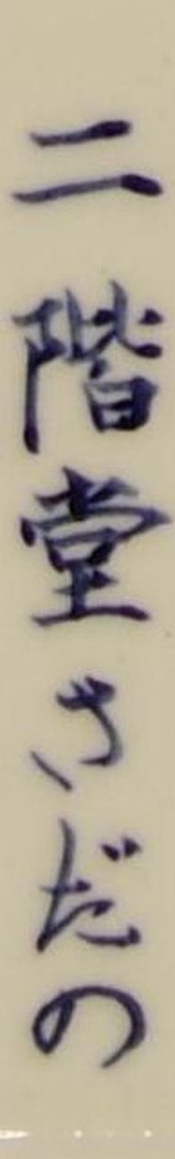二階堂さだの
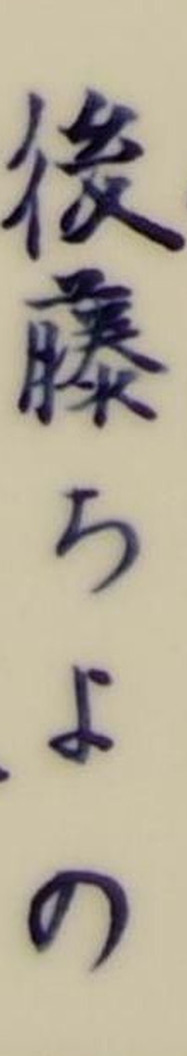後藤ちよの
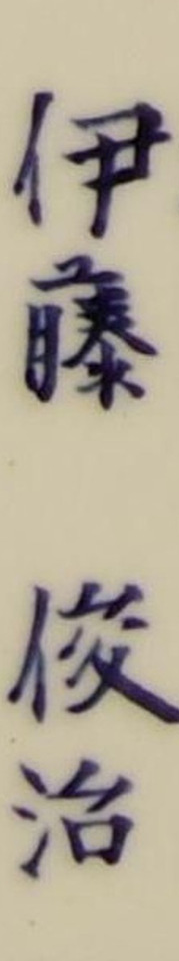伊藤俊治
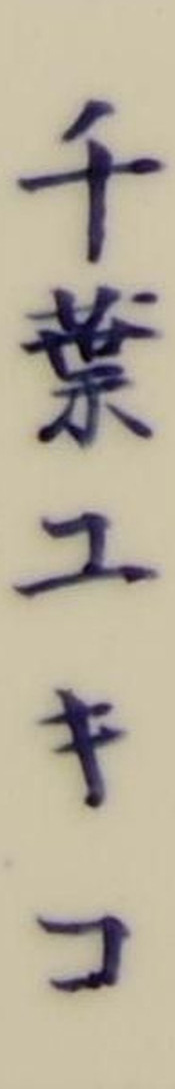千葉ユキコ
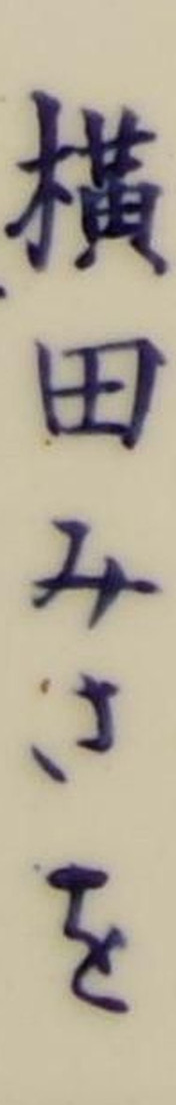横田みさを
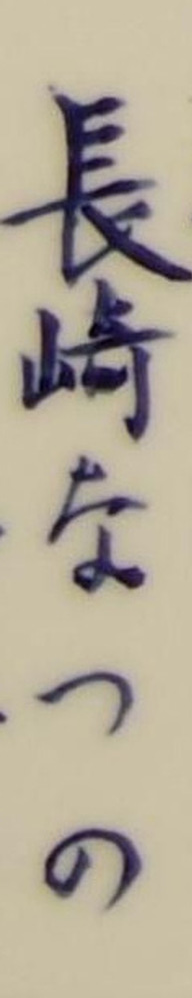長崎なつの
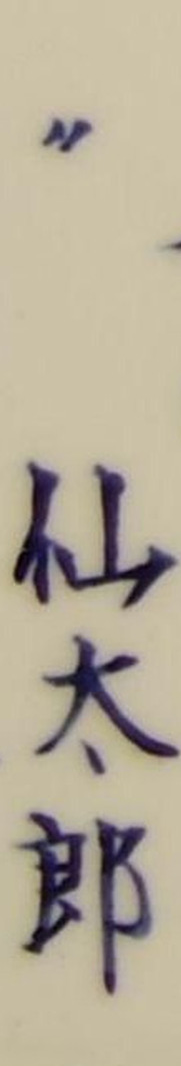仙太郎
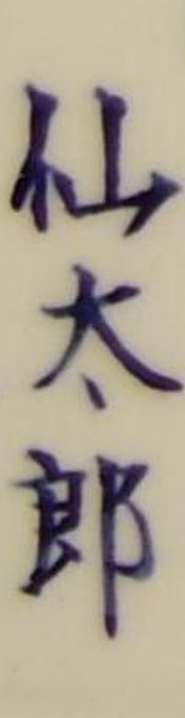仙太郎
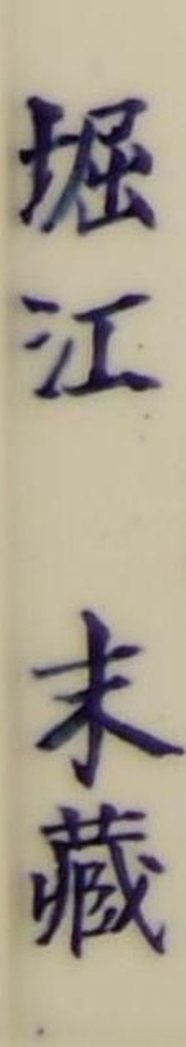堀江末蔵

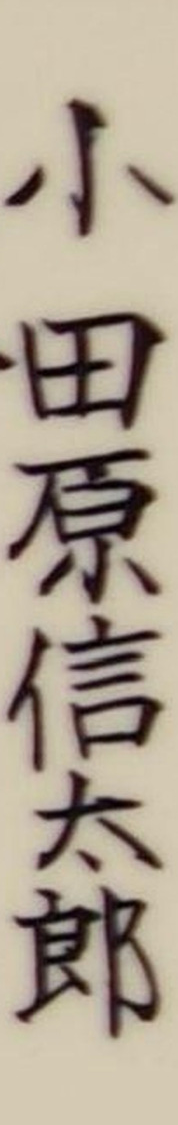小田原信太郎
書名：A~D
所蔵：koyasan kongobuji
